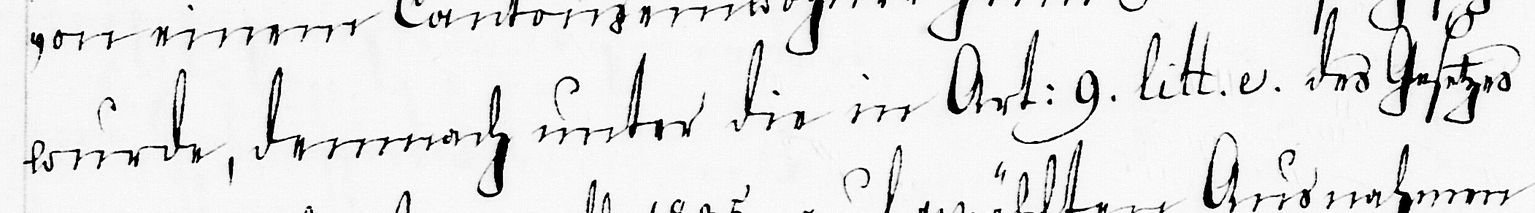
wurde, demnach unter die in Art: 9. litt. e. des Gesetz¬
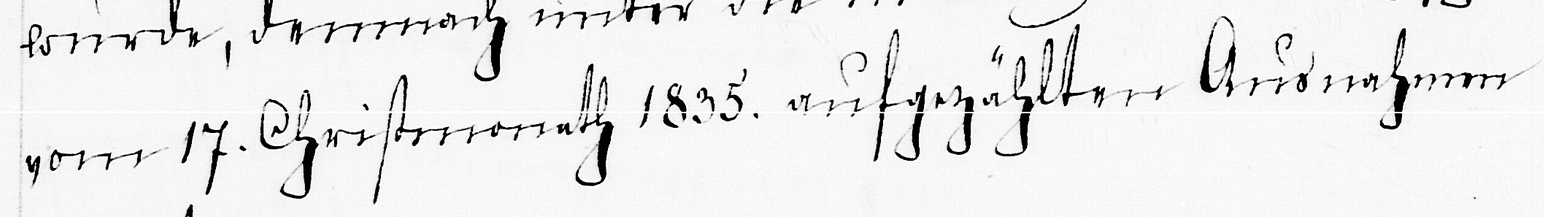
vom 17. Christmonath 1835. aufgezählten Ausnahmen
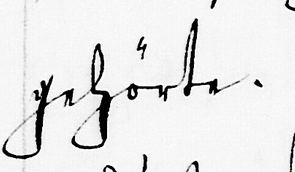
gehörte.
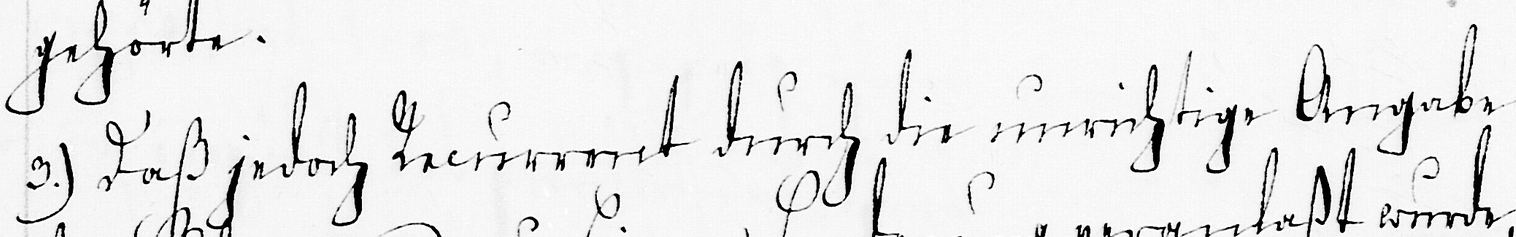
3.) Daß jedoch Recurrent durch die unrichtige Angabe
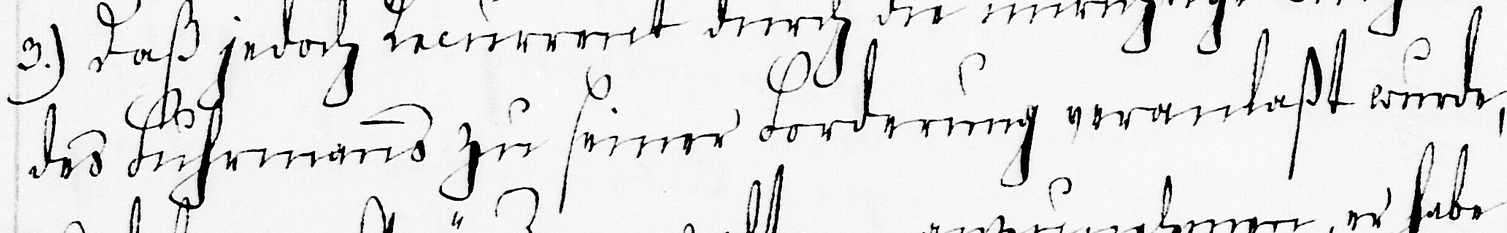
des Fuhrmanns zu seiner Forderung veranlaßt wurde,
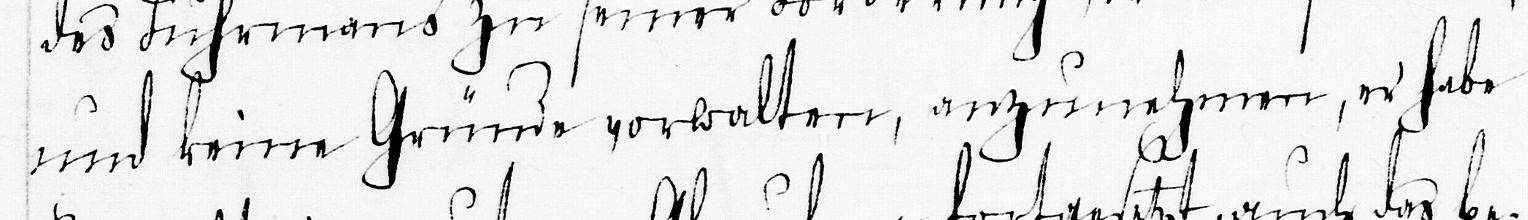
und keine Gründe vorwalten, anzunehmen, er habe
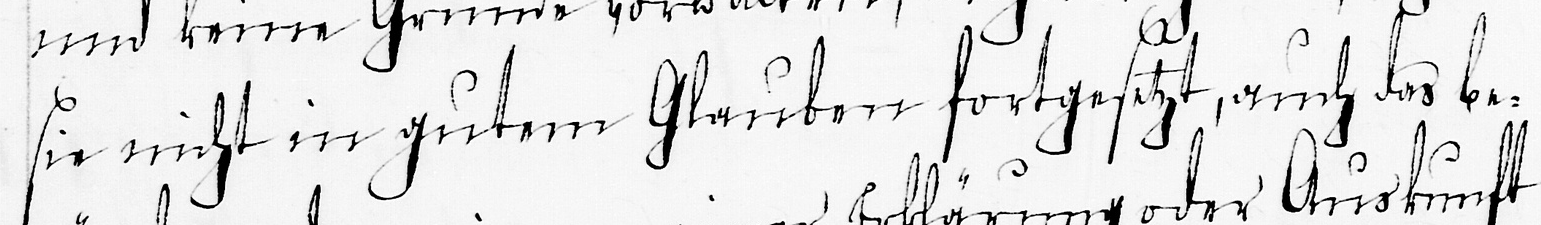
sie nicht in gutem Glauben fortgesetzt, auch das bes¬
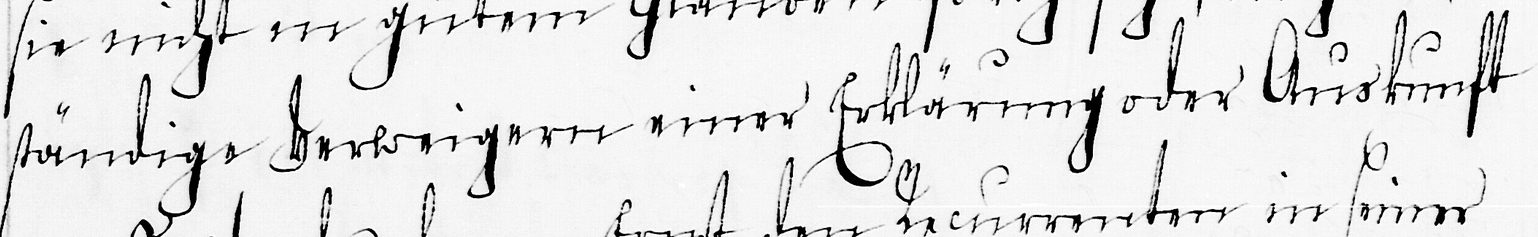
tändige Verweigern einer Erklärung oder Auskunft
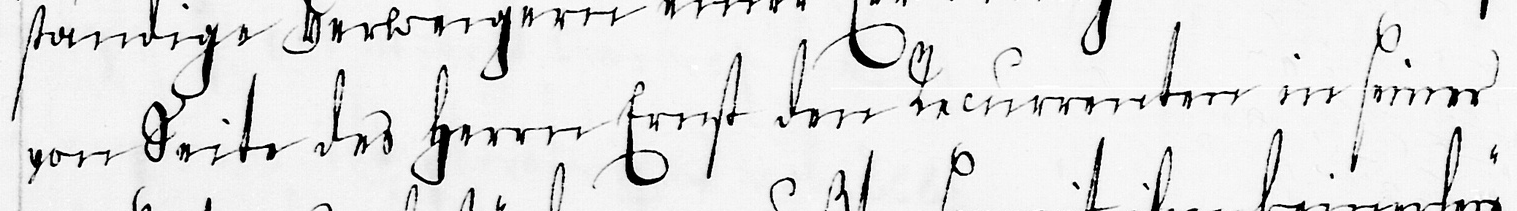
von Seite des Herrn Ernst den Recurrenten in seiner
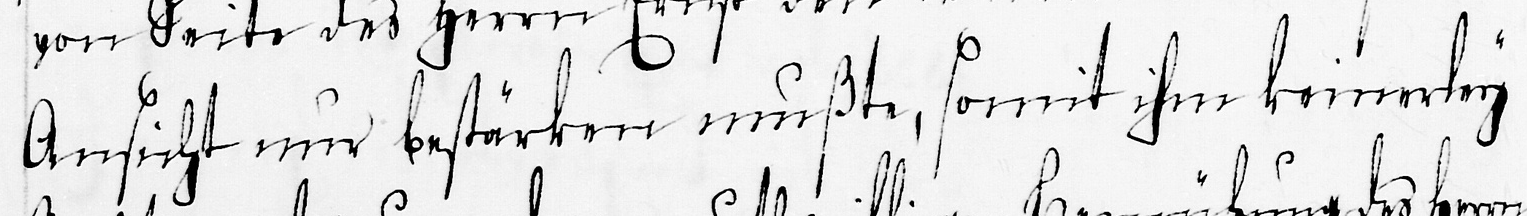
Ansicht nur bestärken mußte, somit ihm keinerley
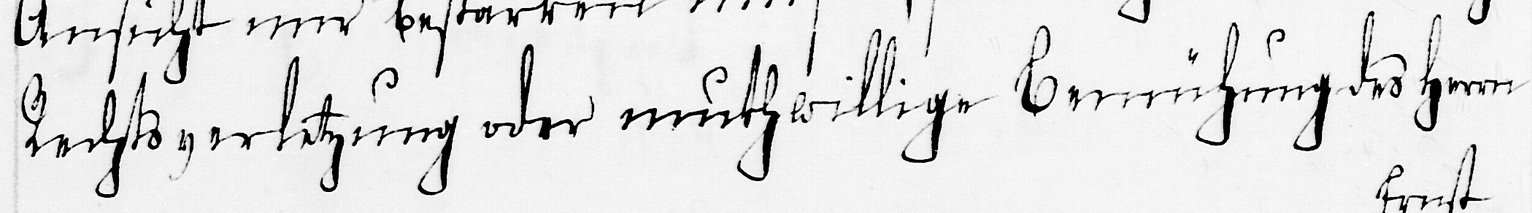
Rechtsverletzung oder muthwillige Bemühung des Herrn
